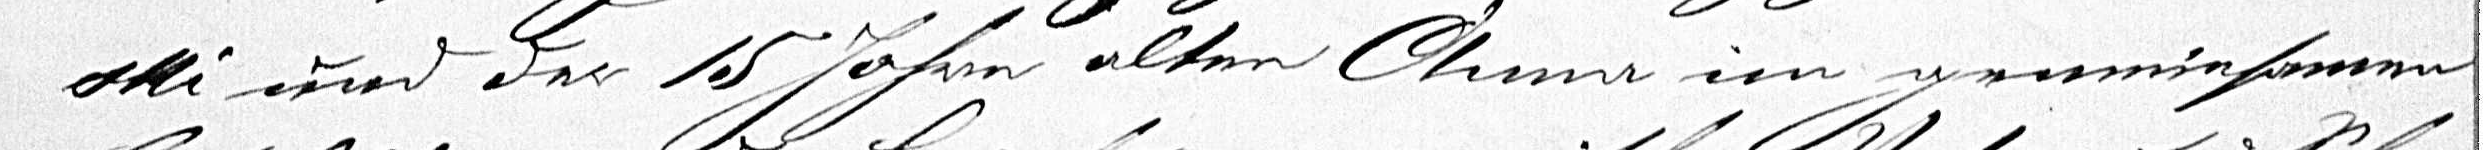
ski und der 15 Jahre alten Anna im gemeinsamen
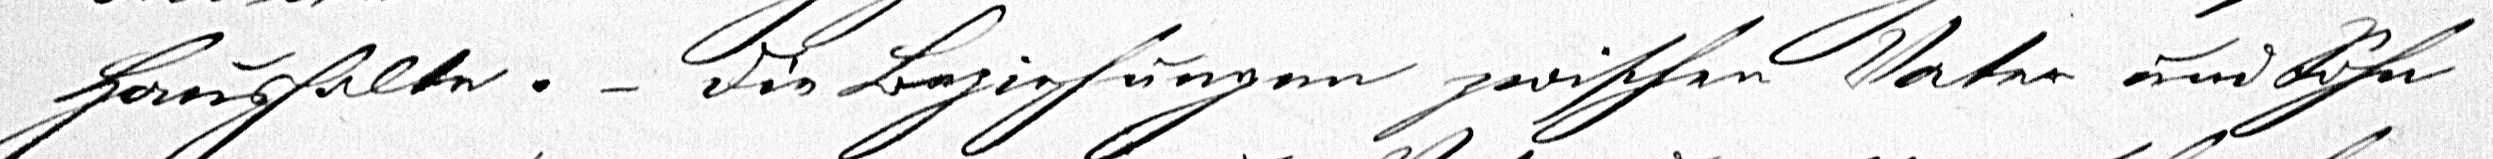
Haushalte. - Die Beziehungen zwischen Vater und Sohn
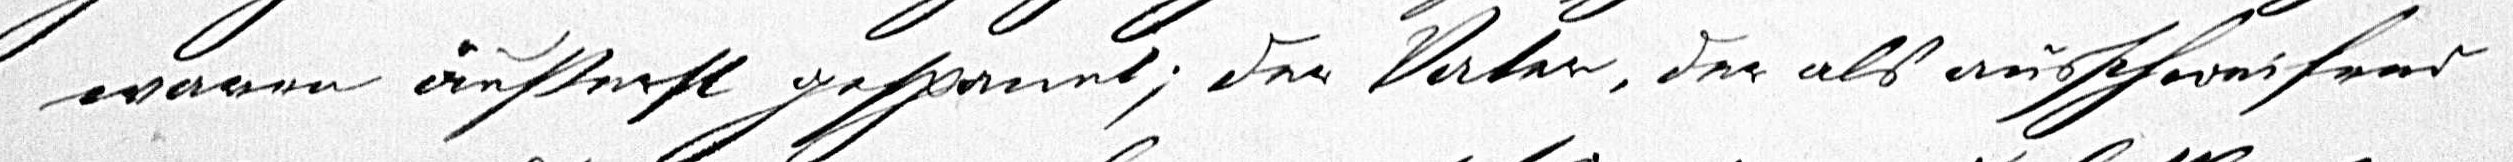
waren äußert gespannt; der Vater, der als ausschweifend
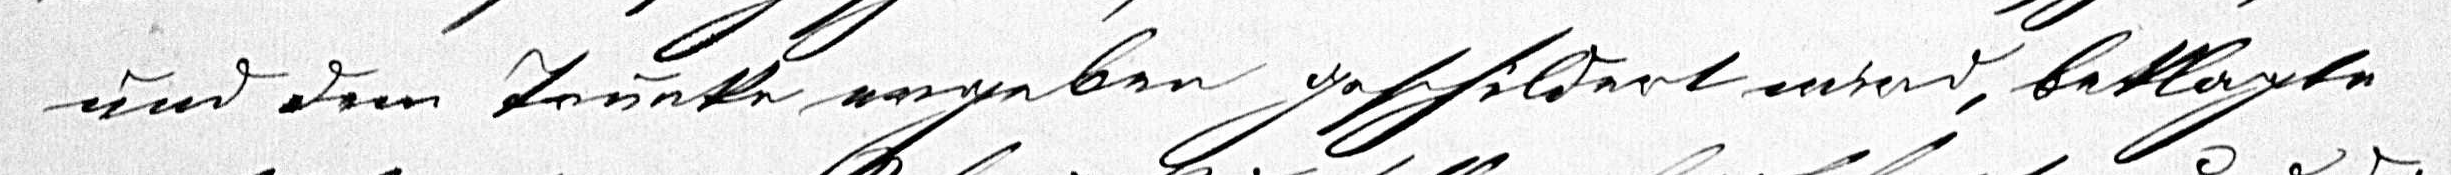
und dem Trunke ergeben geschildert wird, beklagte
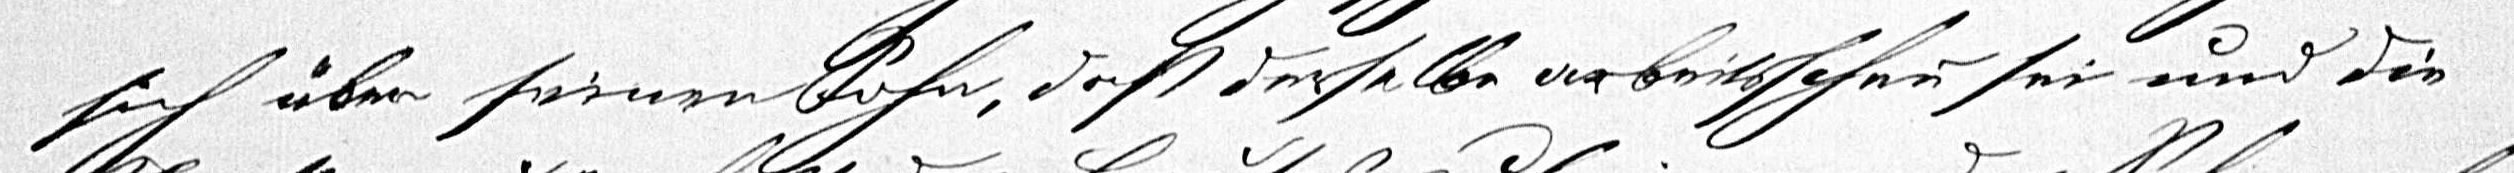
sich über seinen Sohn, daß derselbe arbeitsscheu sei und die
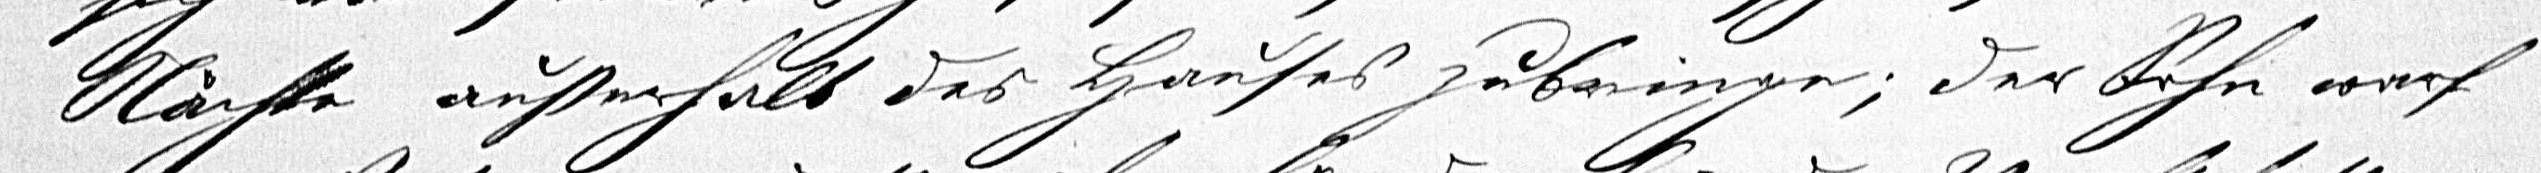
Nächste außerhalb des Hauses zubringe; der Sohn warf
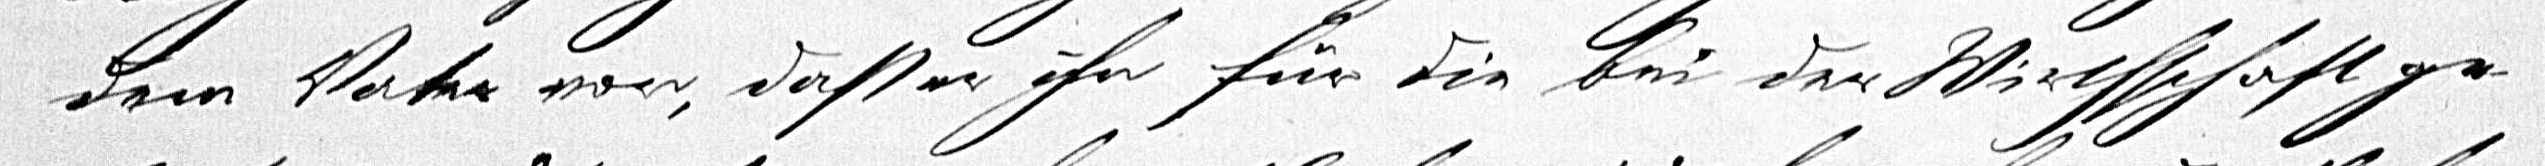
dem Vater vor, daß er ihn für die bei der Wirtschaft ge¬
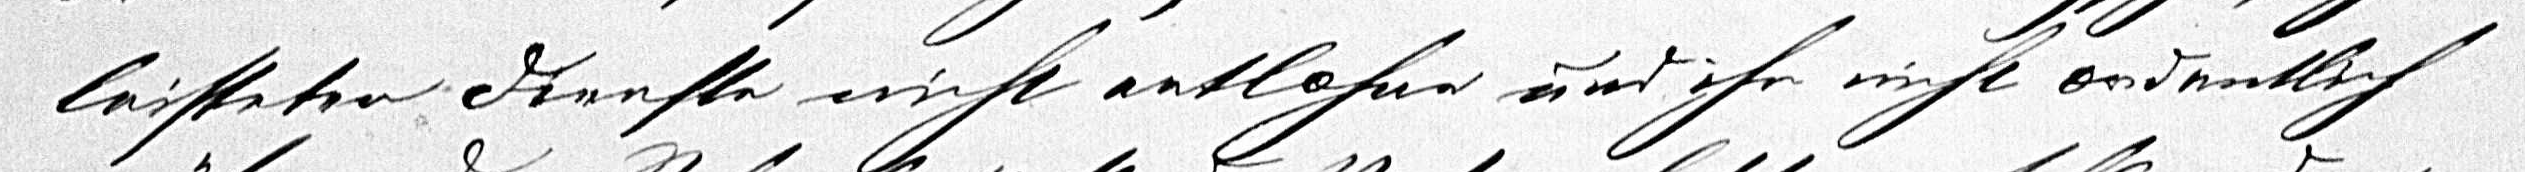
leisteten dienste nicht entlohne und ihn nicht ordentlich
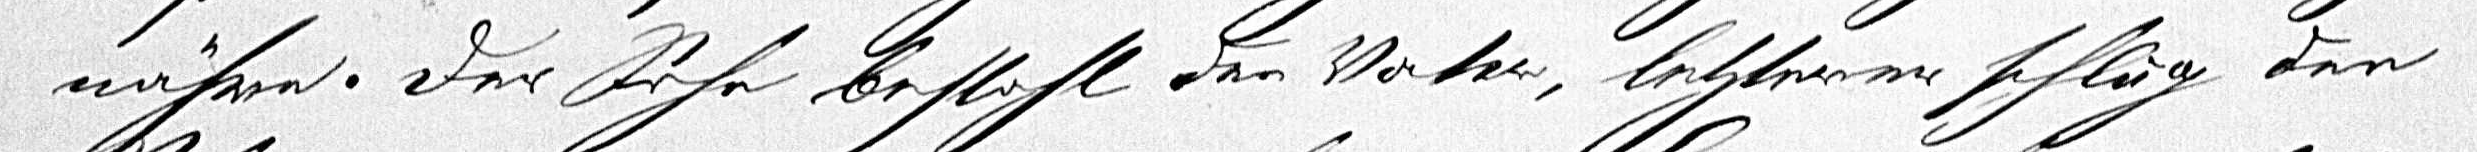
nähre. Der Sohn bestahl den Vater, letzterer schlug den
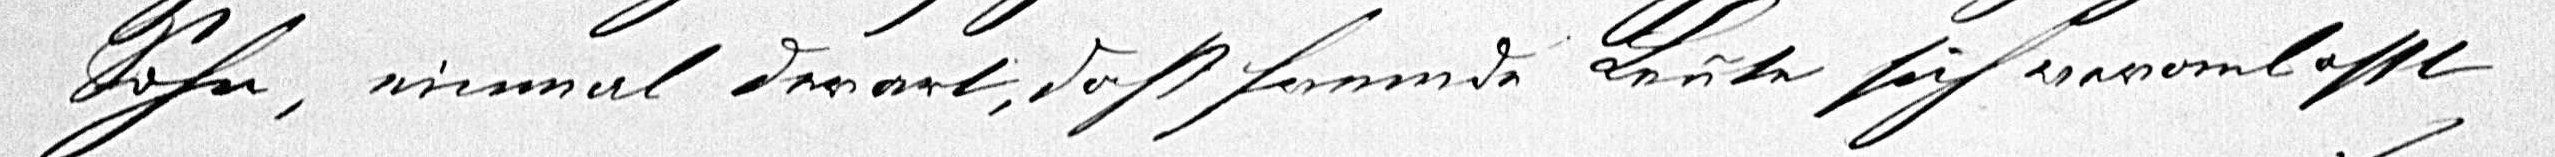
Sohn, einmal derart, daß fremde Leute sich veranlaßt
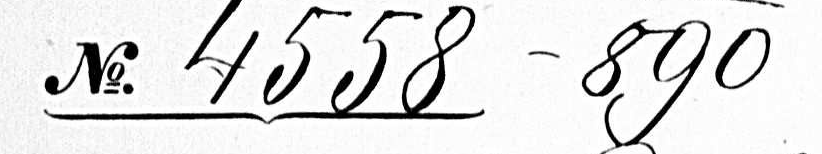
No. 4558 - 890
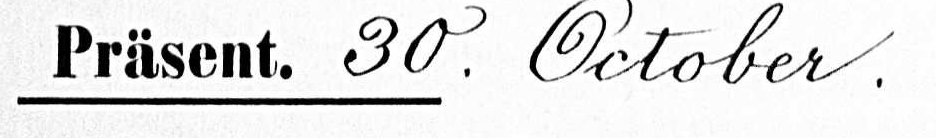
Präsent. 30. October.
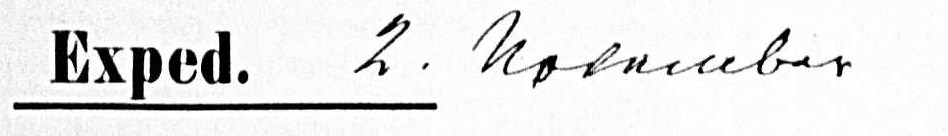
Exped. 2. November
